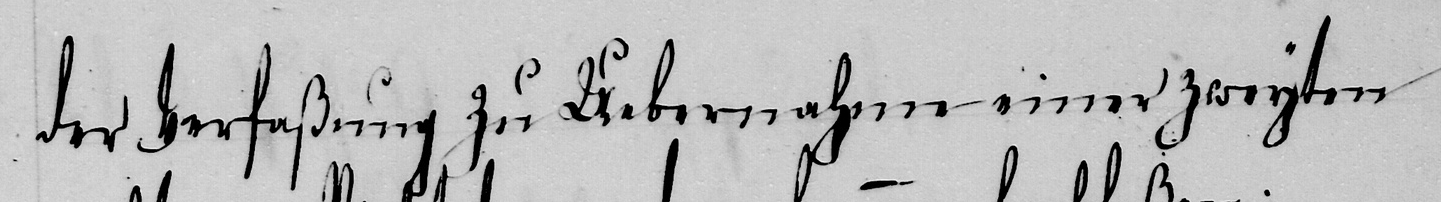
der Verfaßung zu Uebernahme einer zweyten
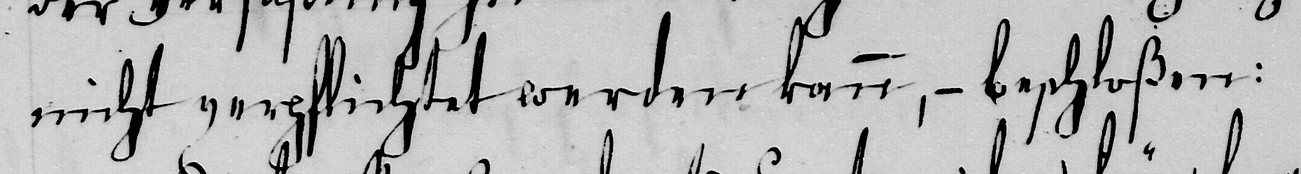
nicht verpflichtet werden kann, beschloßen:
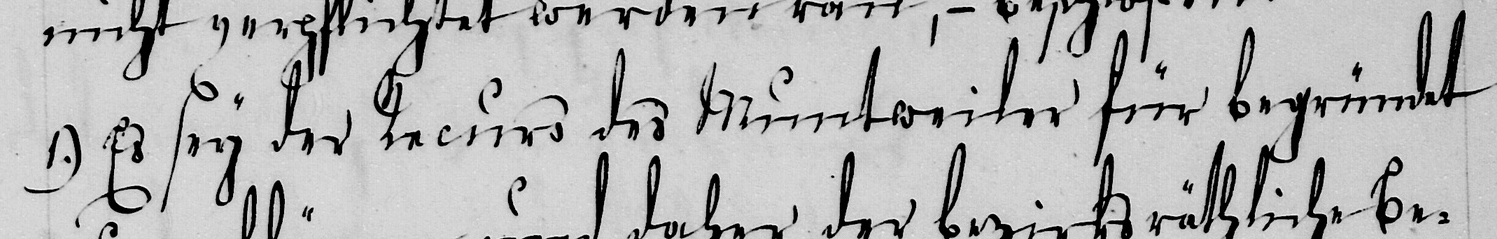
1.) Es sey der Recurs des Muntweiler für begründet
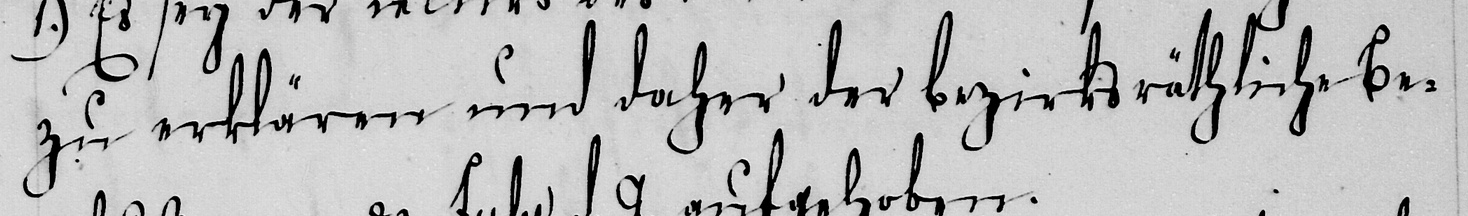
zu erklären und daher der bezirksräthliche Be¬
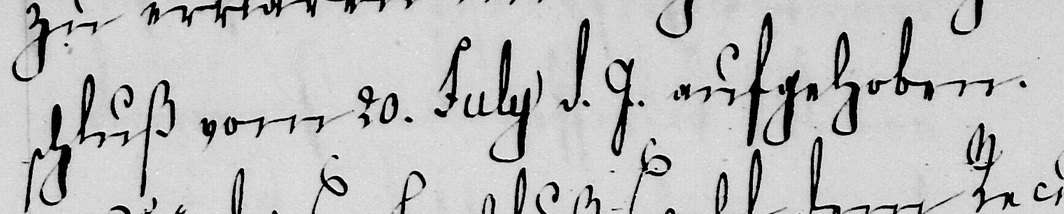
schluß vom 20. July d. J. aufgehoben.
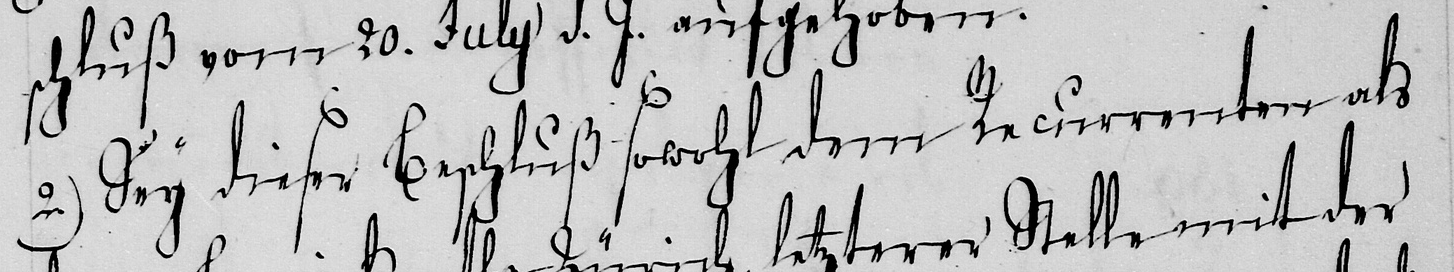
2.) Sey dieser Beschluß sowohl dem Recurrenten als
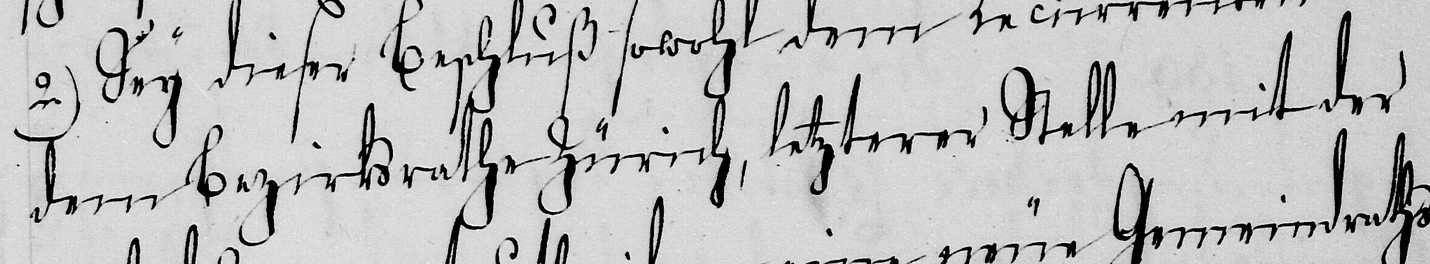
dem Bezirksrathe Zürich, letzterer Stelle mit der
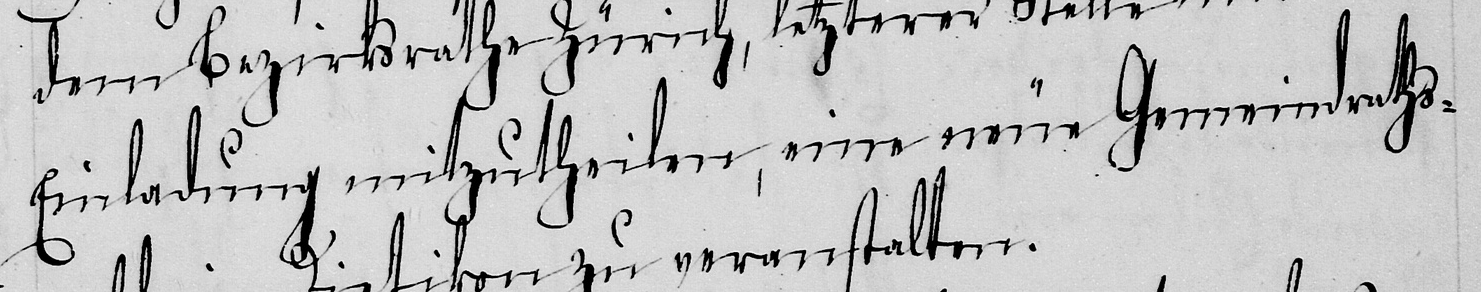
Einladung mitzutheilen, eine neue Gemeindraths¬
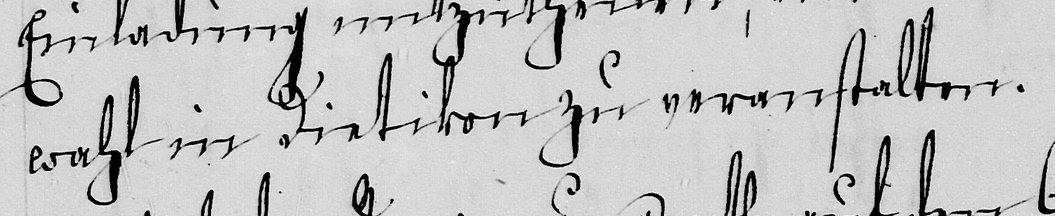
wahl in Dietikon zu veranstalten.
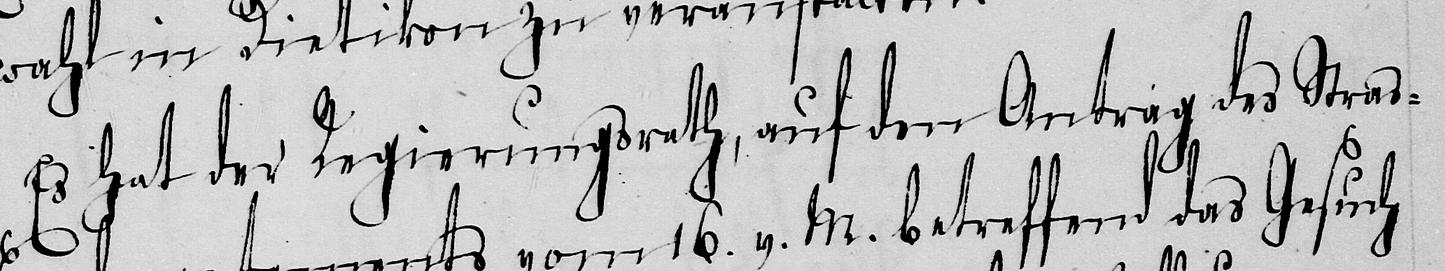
Es hat der Regierungsrath, auf den Antrag des Straß¬
